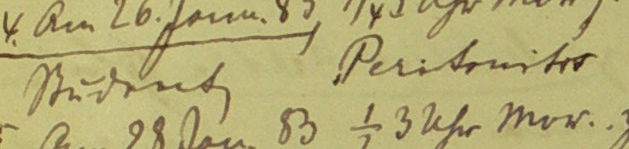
Student, Peritonitos
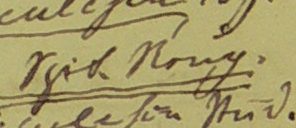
Spit. Neug.
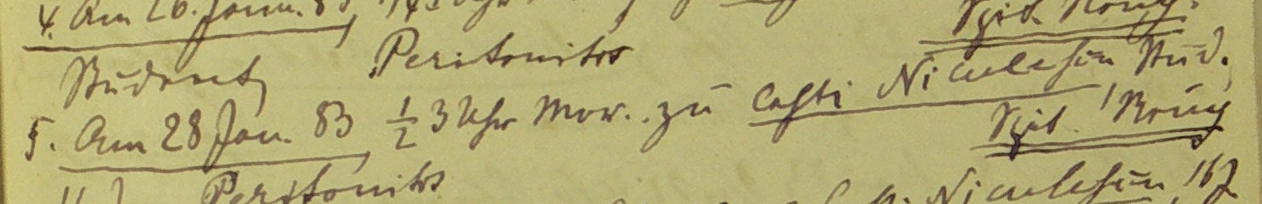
5. Am 28. Januar 83, ½ 3 Uhr, Morg. Zu Costi Niculescu,
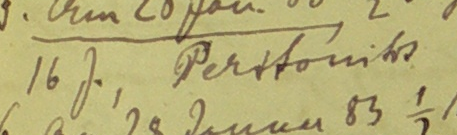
16 J. alt, Student Peritonitos
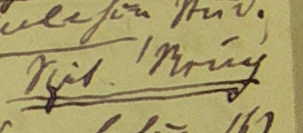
Spit.Neug
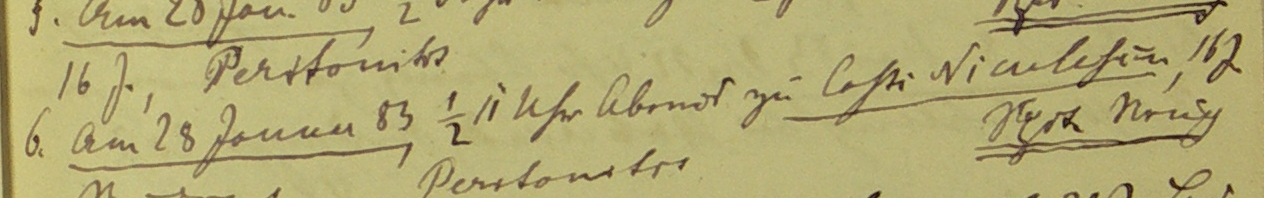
6. Am 28 Januar 83 , ½ 1 Uhr Abends, zu Costi Niculescu, 16 J.
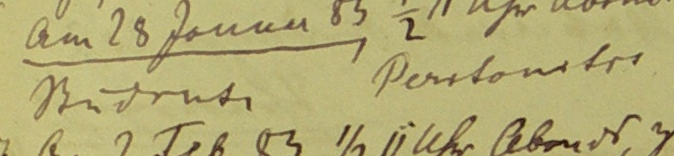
alt, Student Peritonitos,
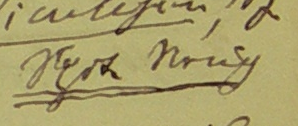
Spit. Neug.
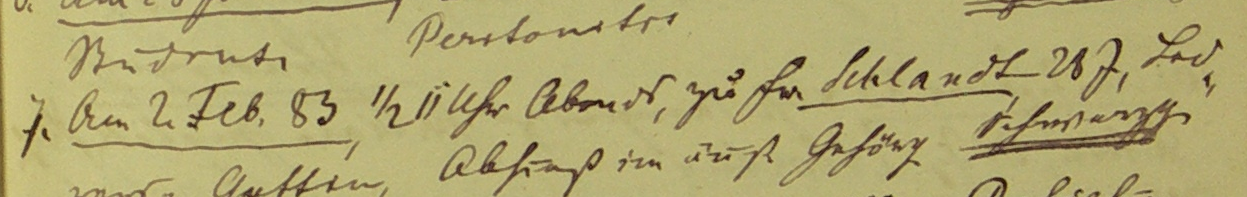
7. Am 2. Febr. 83, ½ 11 Uhr Abends, zu Fr. Schlandt 28 J., ßLod¬
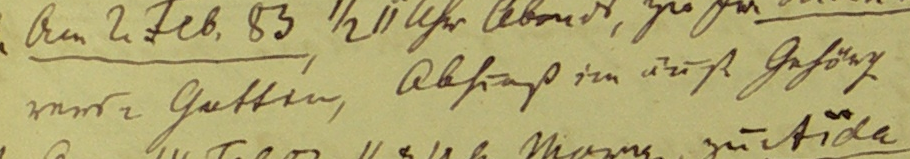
rers Gattin, Absceß im äußer. Gehörgang
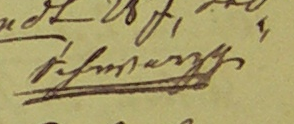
Schwarzgasse
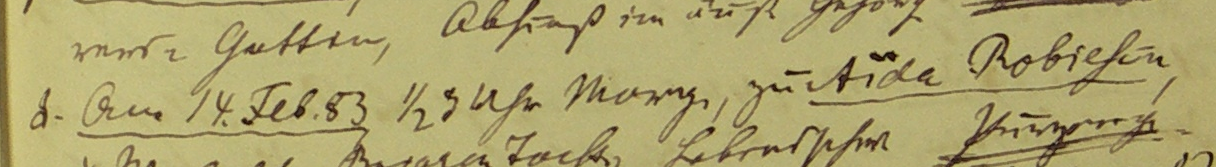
8. Am14. Febr. 83, ½ Uhr Morg., zu Aida Robichin,
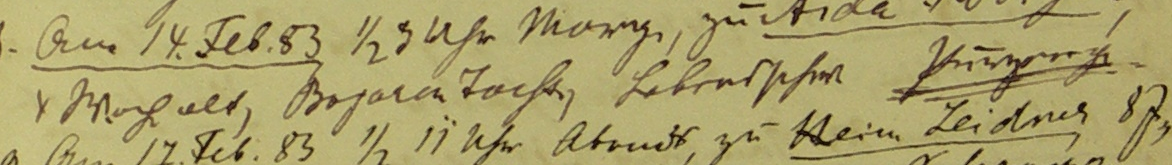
4 Wochen alt, Bojaren Tochter, Lebensgefahr
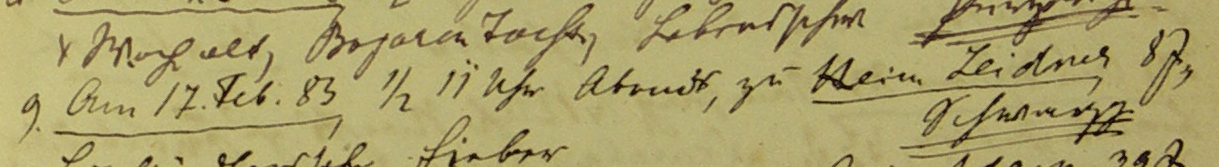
9. Am 17. Febr. 83, ½ 11 Uhr, Abends, zu Heinr. Zeidner 8 J.
